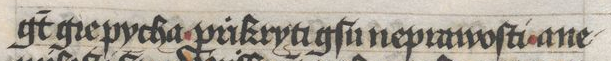ḡt gie pycha.pṙikryti gſu neprawoſti.ane¬
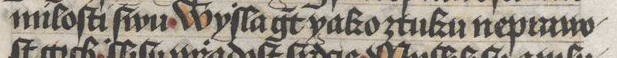miloſti ſwu.Wyẛla ḡt yako ztuku neprawo¬
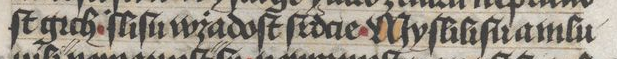ſt gich.ẛliſu wżadoſt ſrdcie.Myſliliſu a mlu¬
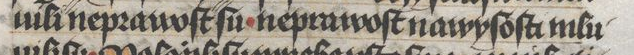uili neprawoſt ſu.nawyſoſti mlu¬
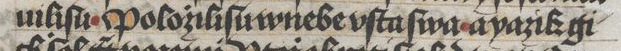uiliſu.Polożiliſu wnebe vſta ſwa.a yazik gi¬
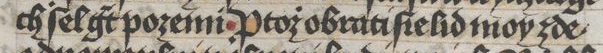ch ẛel ḡt pozemi.Ꝓtoż obrati ſie lid moy zde
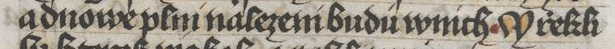a dnowe plni nalezeni budú wnich.Y ṙekli¬
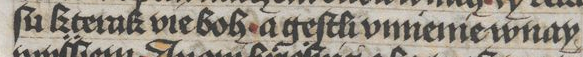ſu kterak víe boh.a geſtli vmienie wnay
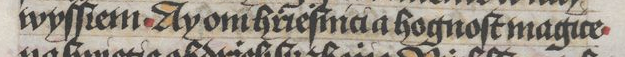wyẛẛiem.Ay oni hṙieẛníci a hognoſt magice.
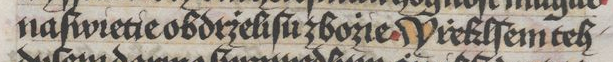naſwietie obdrželiſu zbożie.Yṙeklſem teh¬
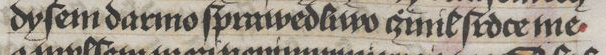dyſem darmo ſprawedliwo cżinil ſrdce me.
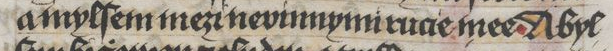a mylſem mezi nevinnymi rucie mee.A byl
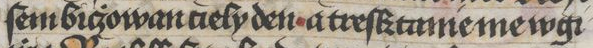ſem bicżowan ciely den.a treſktanie me wgi¬
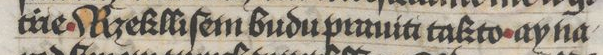tṙie.Rzeklliſem budu prauiti takto.ay na¬
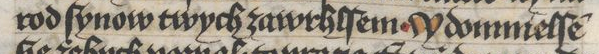rod ſynow twych zawrhlſem.Y domnielſē
